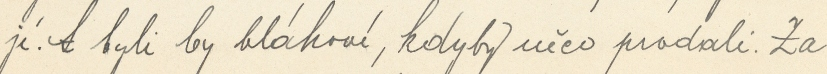jí. A byli by bláhoví, kdyby něco prodali. Za
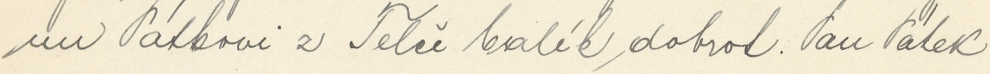nu Pátkovi z Telče balík dobrot. Pan Pátek
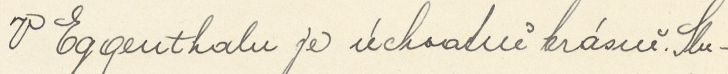V Eggenthalu je úchvatně krásně. Slu-
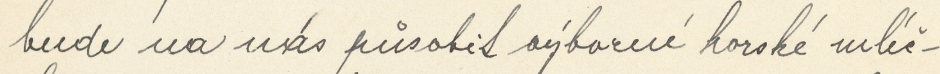bude na nás působit výborné horské mléč-
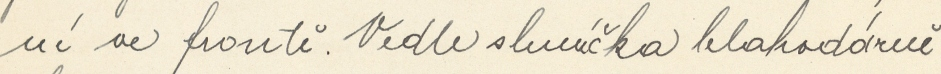ní ve frontě. Vedle sluníčka blahodárně
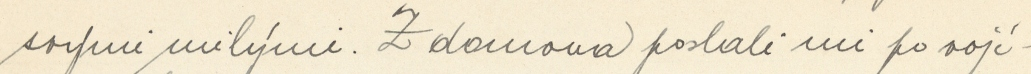svými milými. Z domova poslali mi po vojí-
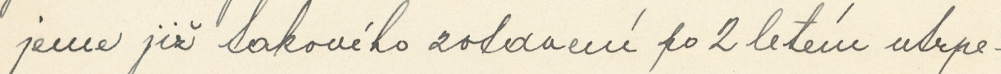jeme již takového zotavení po 2letém utrpe-
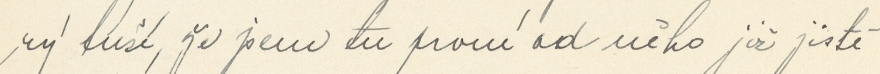rý tuší, že jsem tu první od něho již jistě
